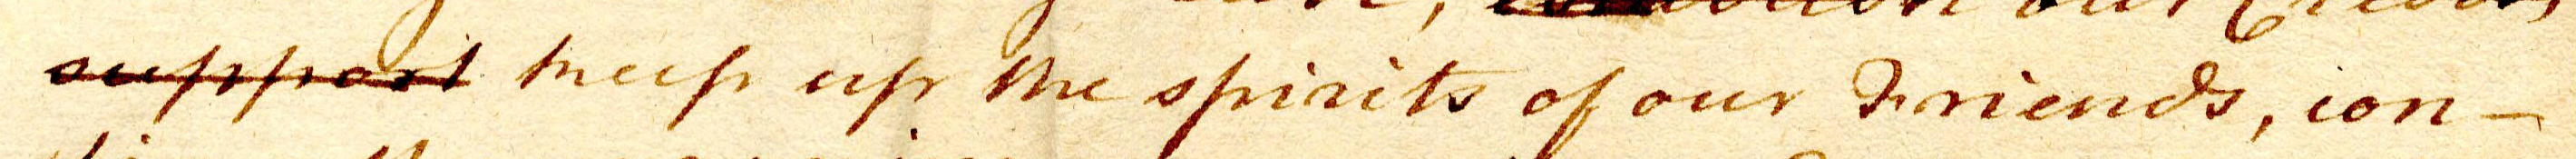support] keep up the spirits of our Friends, con-
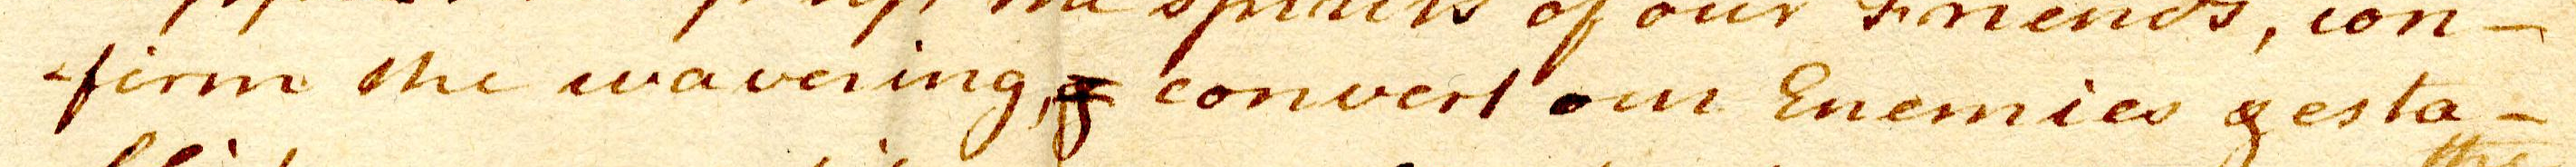-firm the wavering [_] convert our Enemies & esta-
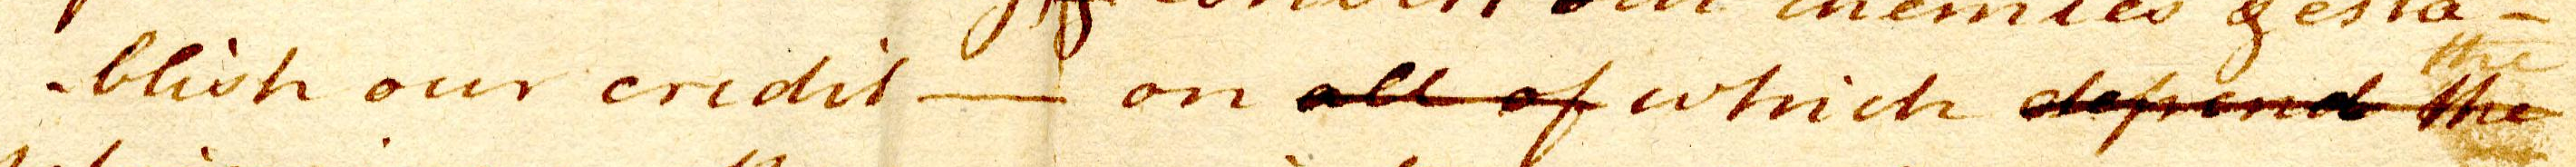-blish our credit- on [all of] which [depend the]
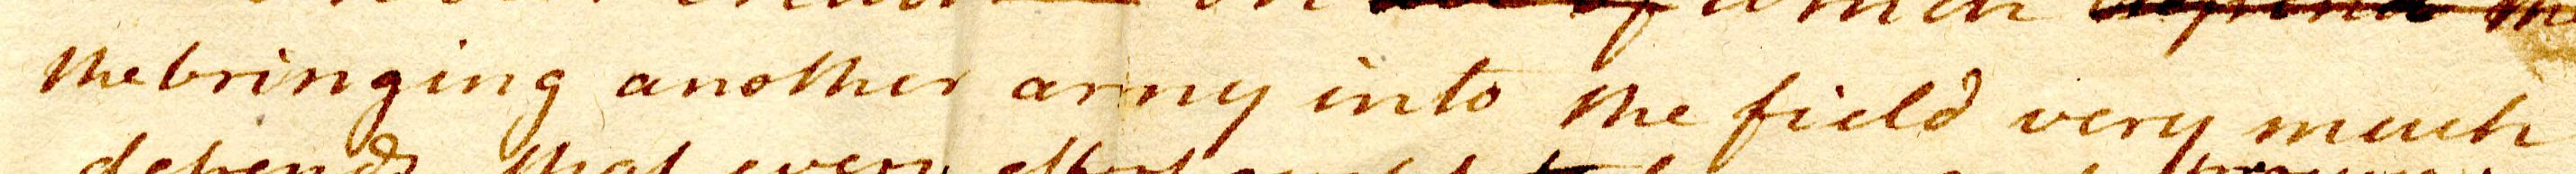the bringing another army into the field very much
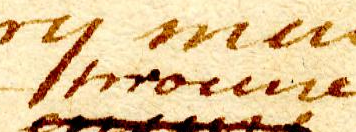procure
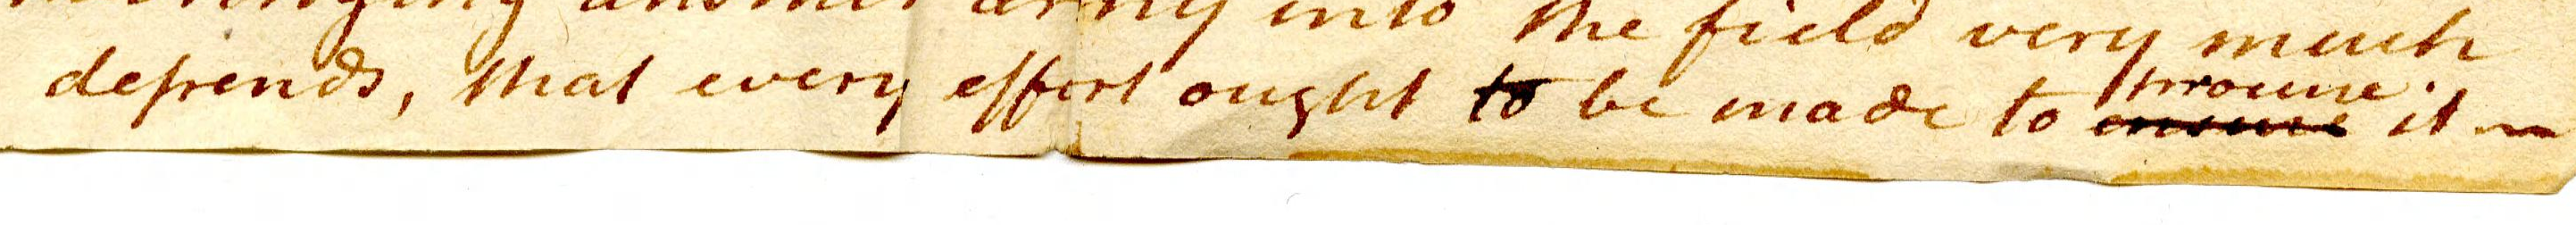depends, that every effort ought to be made to [ensure] it-
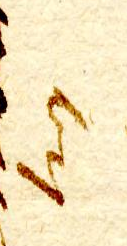by
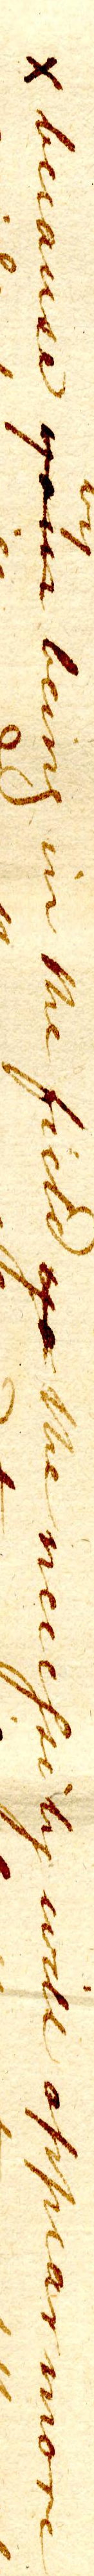X because [your] being in the field [ye] the necessity will appear more
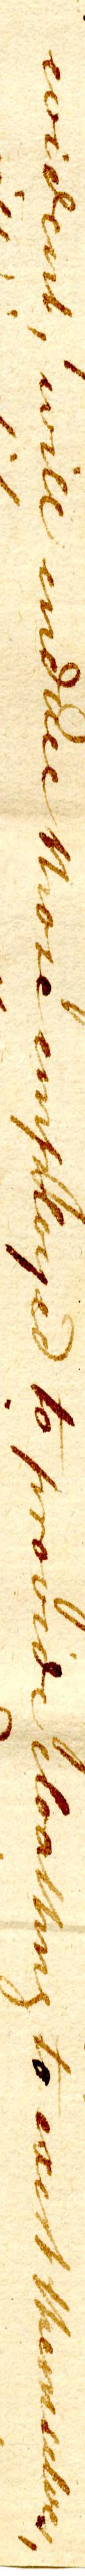evident, will enduce those employed to provide cloathng to exert themselves,
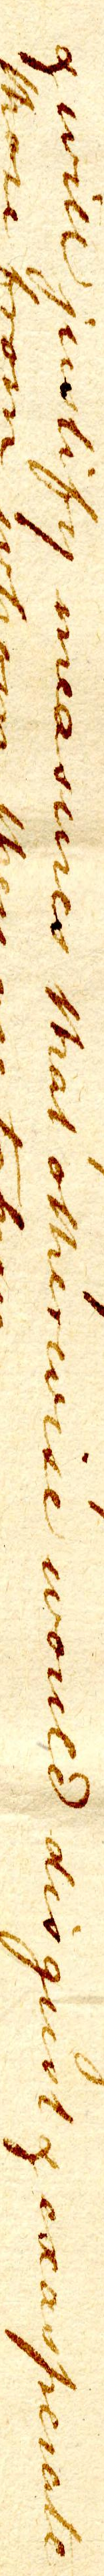& will justify measures that otherwise would disgust & exasperate
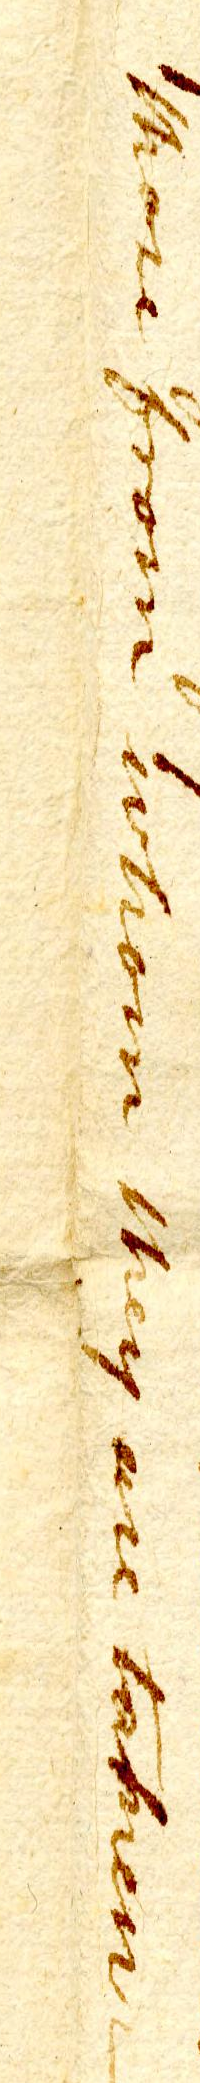those from whom they are taken-
